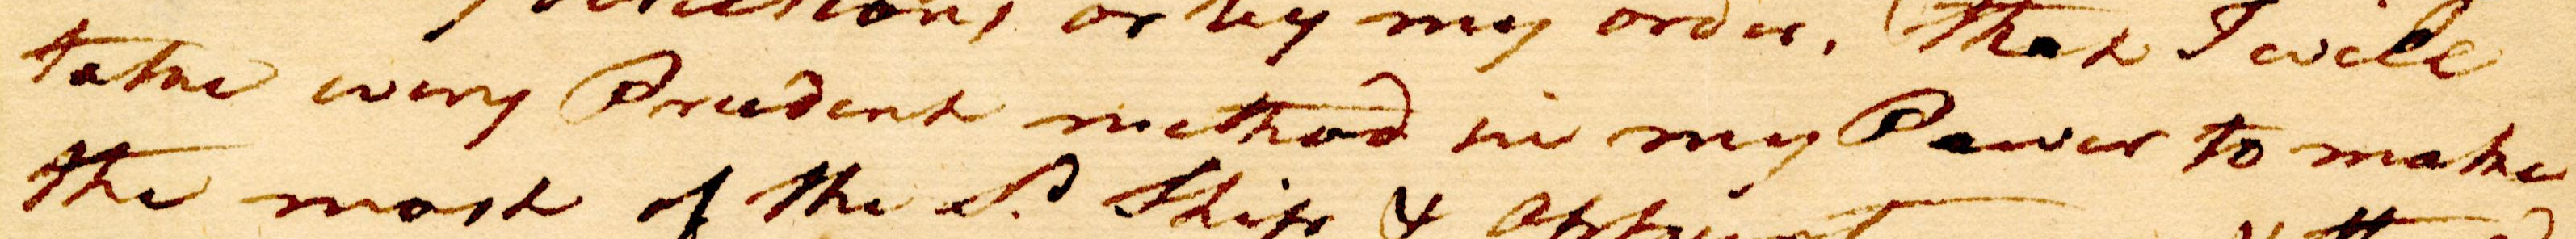take every Prudent method in my power to make
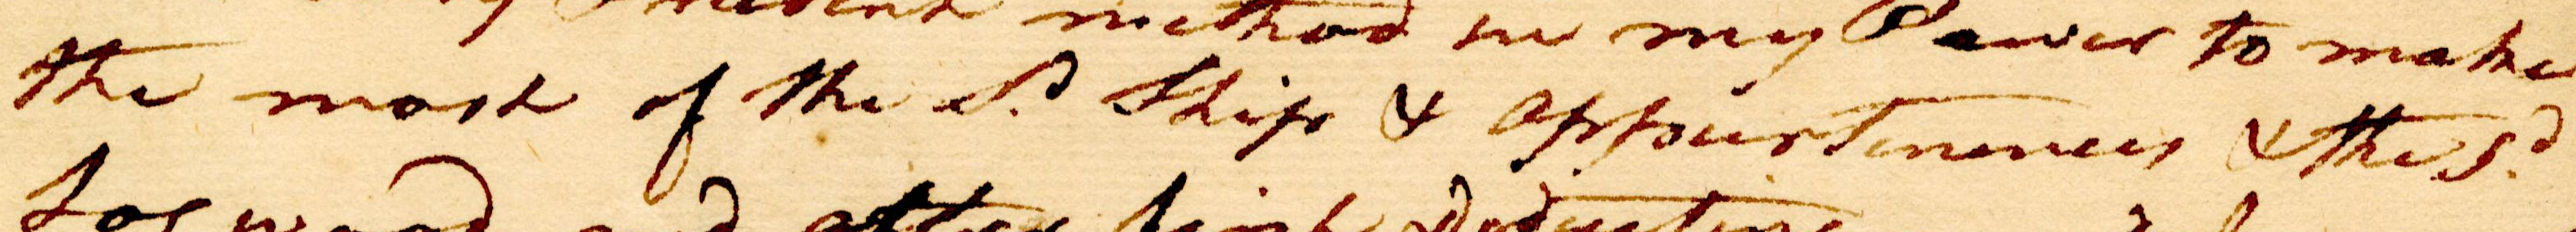the most of the s^d. Ships & appurtenances & the s^d.
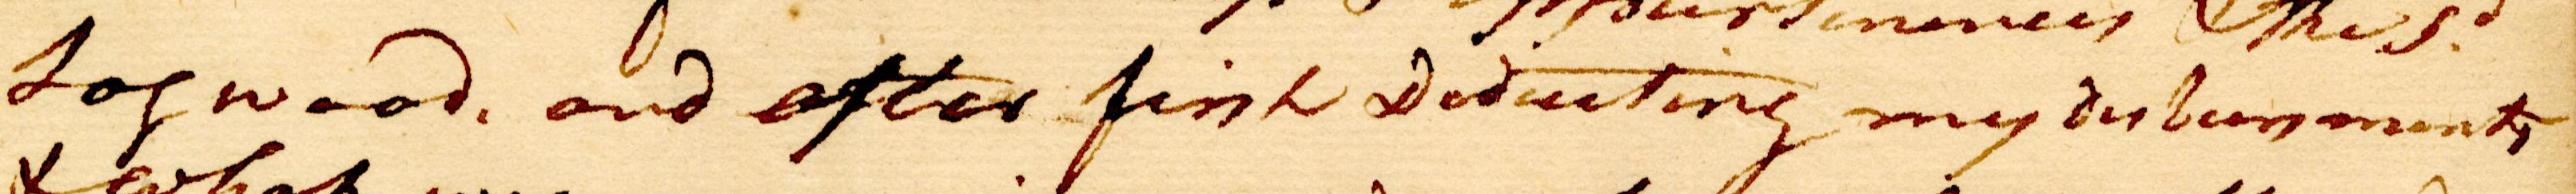Logwood and after first deducting my disbursements
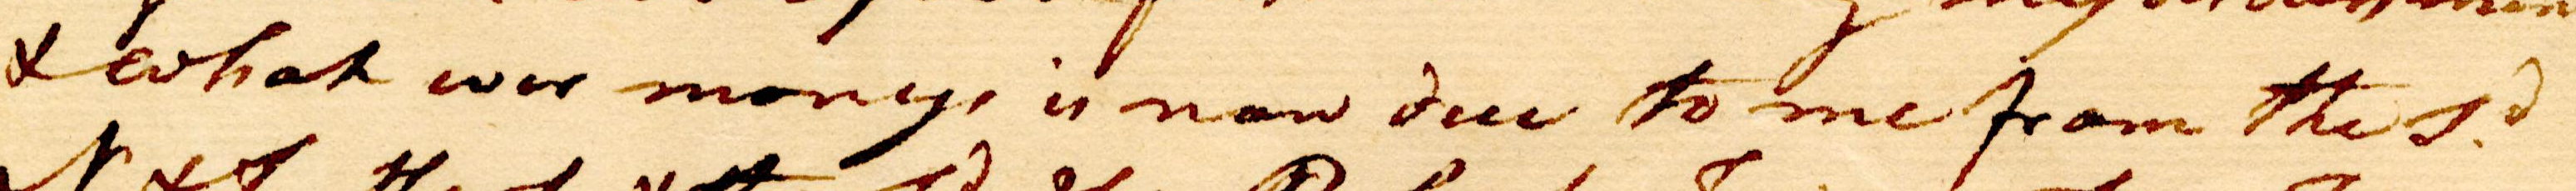& what war moneys is now due to me from the s^d
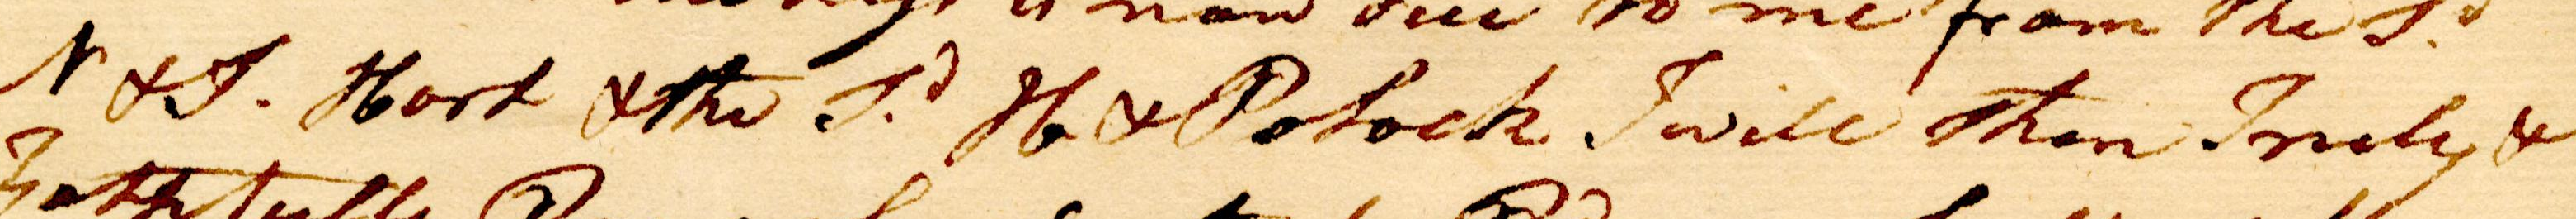N & I Hart & the S^d. H & Potock I will then Truly &
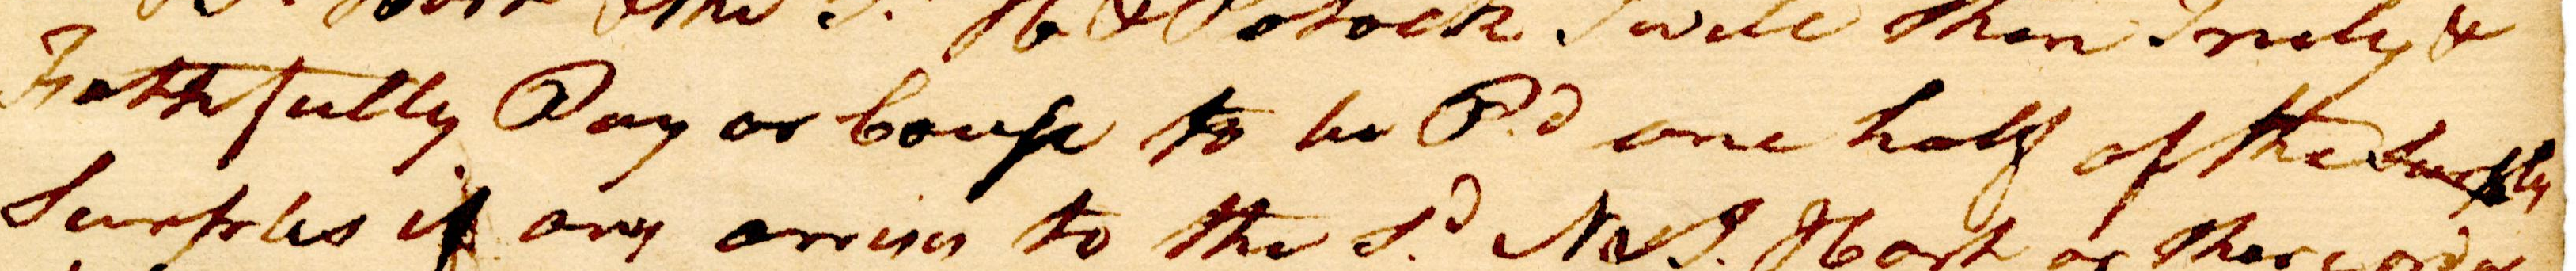Fathfully Pay or Cause to be P^d one half of the Supply
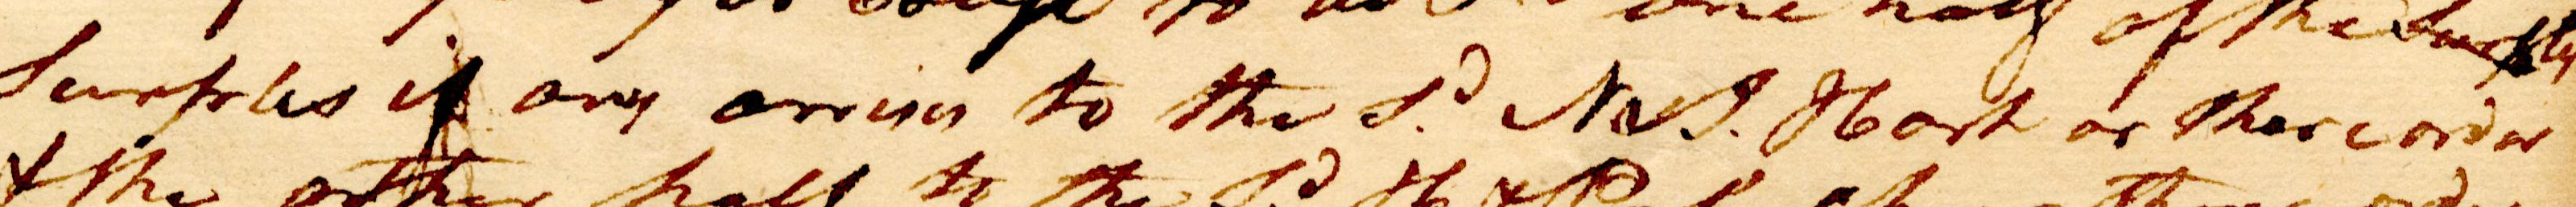surplus if any arises to the s^d. N & I Hart or there order
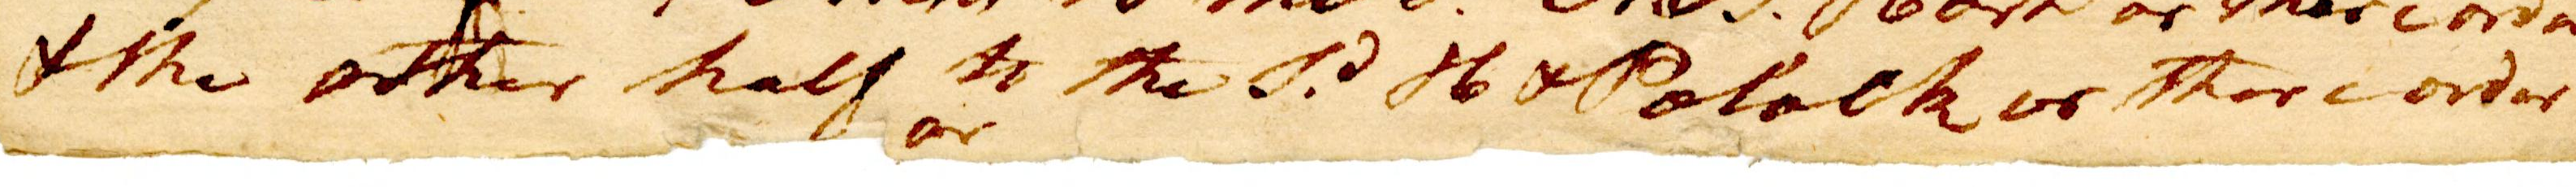& the other half to the S^d. H Polack or there order
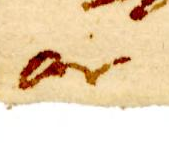or
